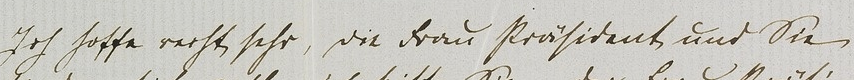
Ich hoffe recht sehr, die Frau Präsident und Sie
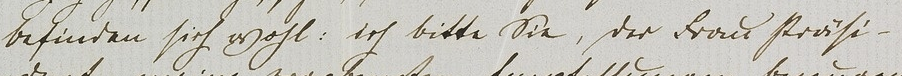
befinden sich wohl: ich bitte Sie, der Frau Präsi-
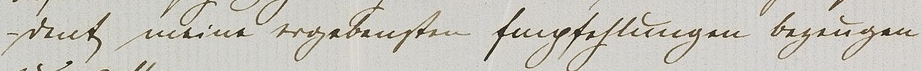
dent meine ergebensten Empfehlungen bezeugen
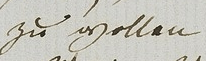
zu wollen.
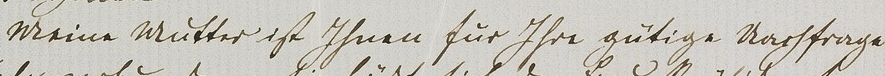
Meine Mutter ist Ihnen für Ihre gütige Nachfrage
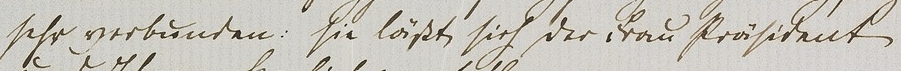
sehr verbunden: sie läßt sich der Frau Präsident
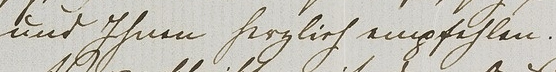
und Ihnen herzlich empfehlen.
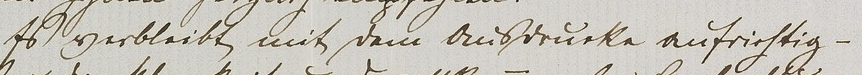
Es verbleibt mit dem Ausdrucke aufrichtig-
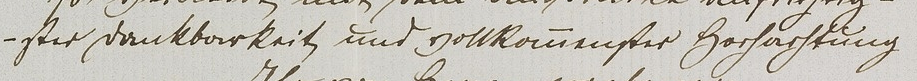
ster Dankbarkeit und vollkommenster Hochachtung
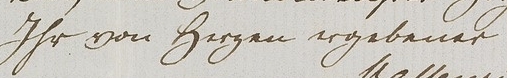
Ihr von Herzen ergebener
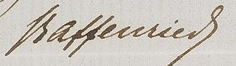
Graffenried
